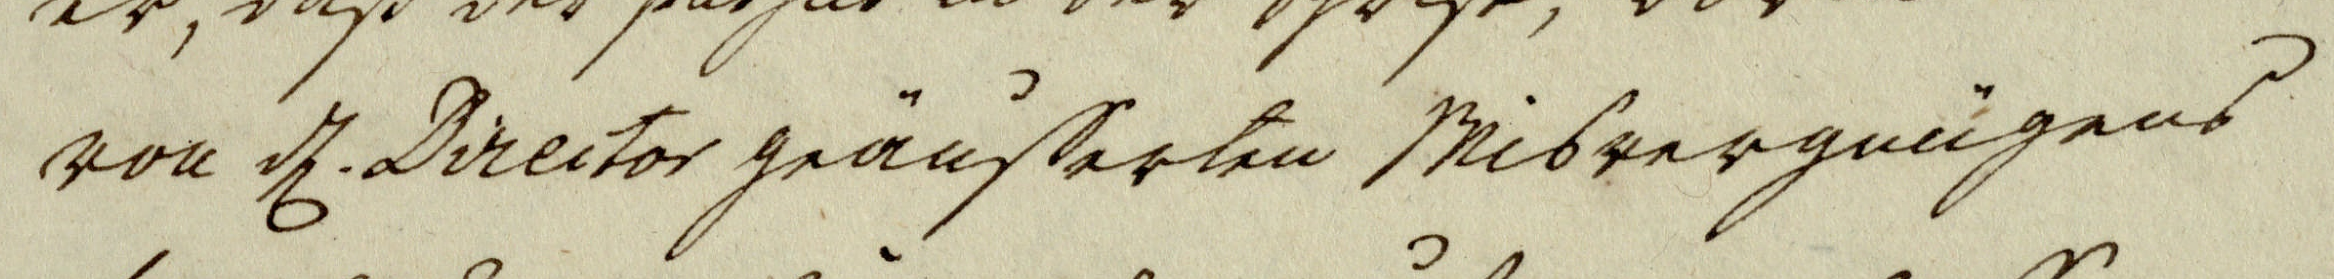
von dh. Director geäusserten Misvergnügens
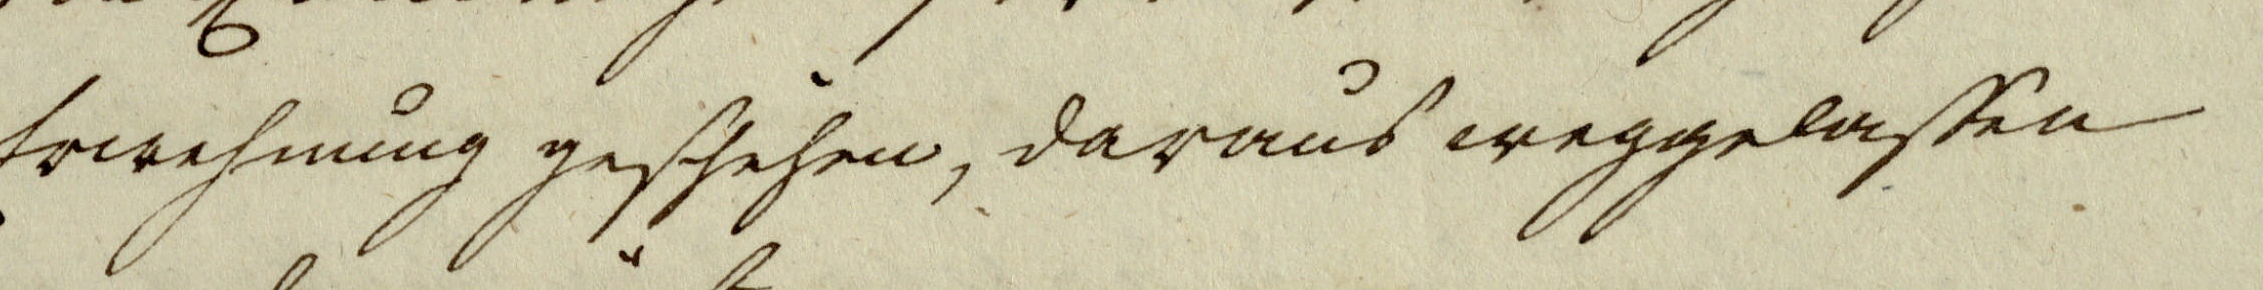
Erwehnung geschehen, daraus weggelassen
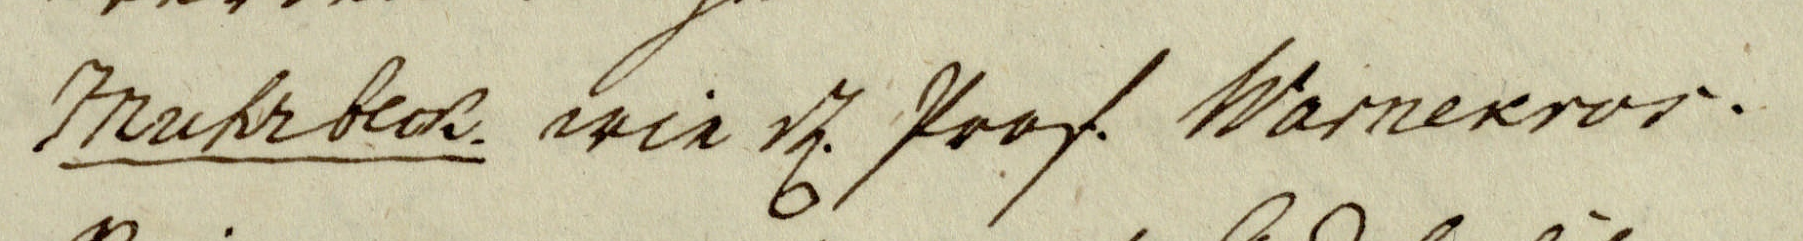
Muhrbeck. wie dh. Prof. Warnekros.
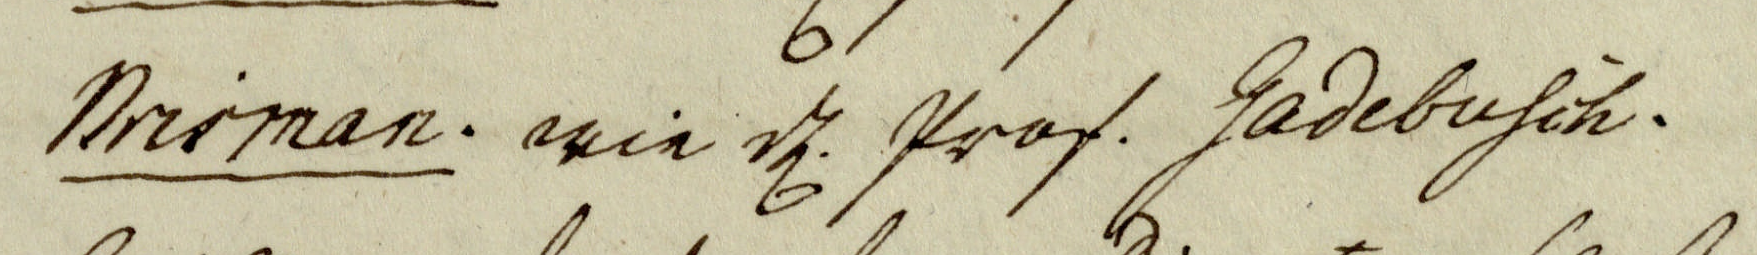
Brisman. wie dh. Prof. Gadebusch.
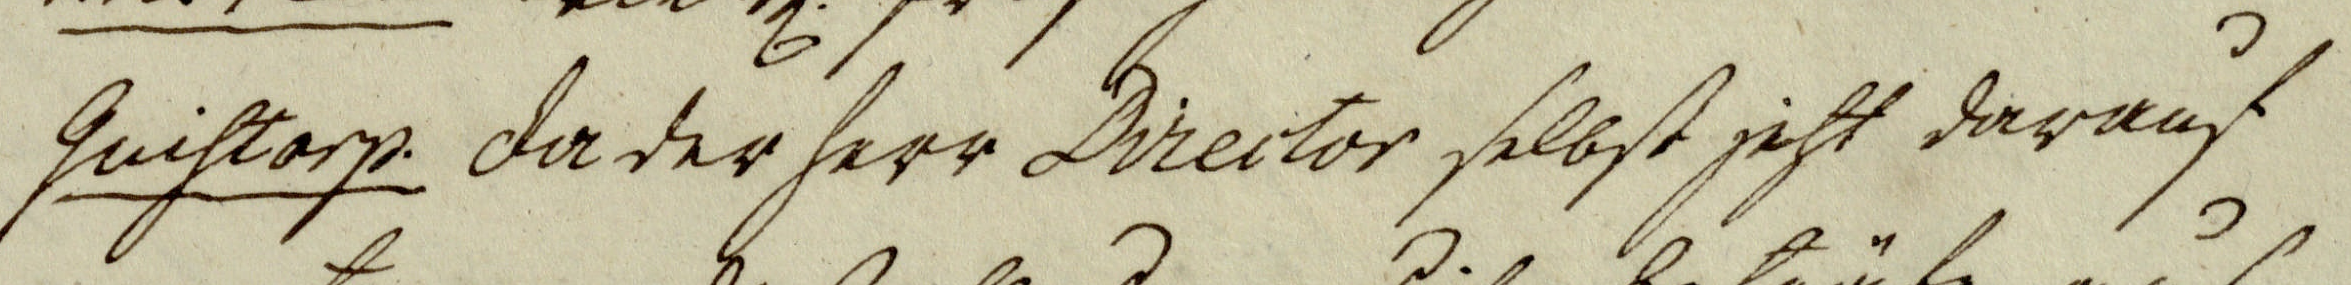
Quistorp. Da der Herr Director selbst jetzt darauf
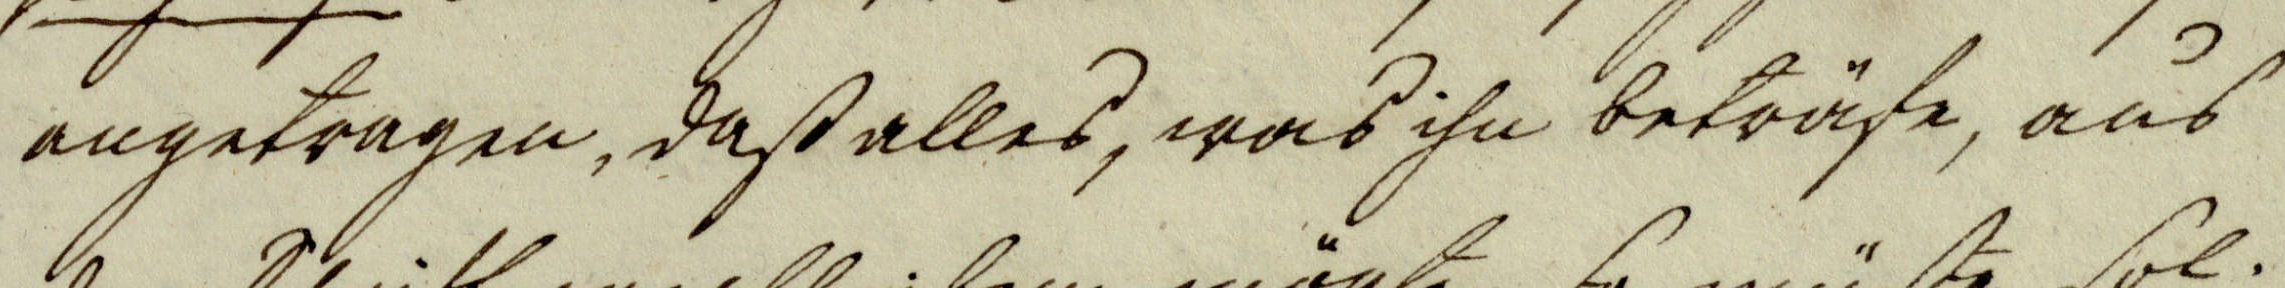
angetragen, daß alles, was ihn beträfe, aus
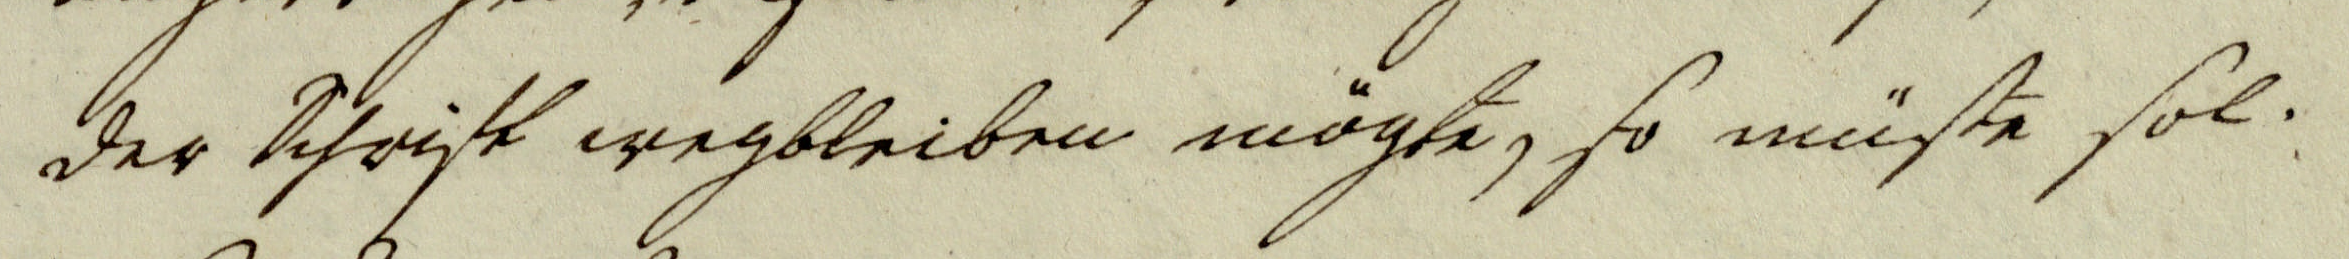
der Schrift wegbleiben mögte, so müßte sol¬
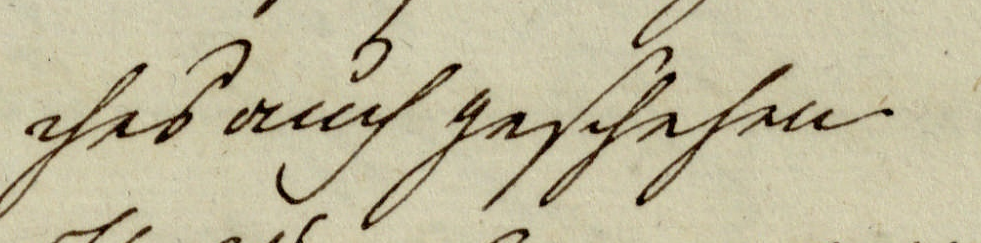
ches auch geschehen.
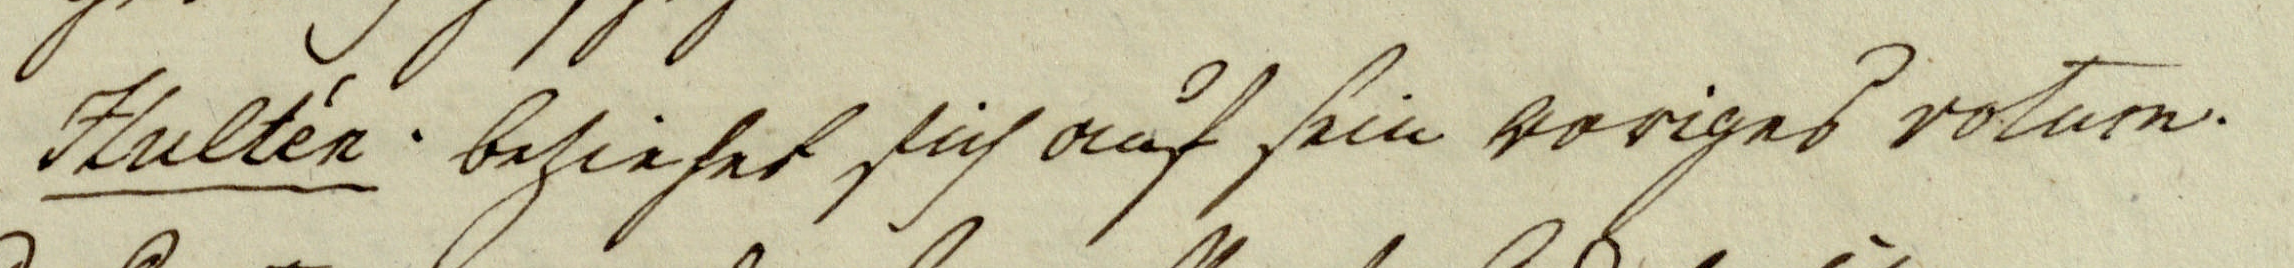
Hultén. beziehet sich auf sein voriges votum.
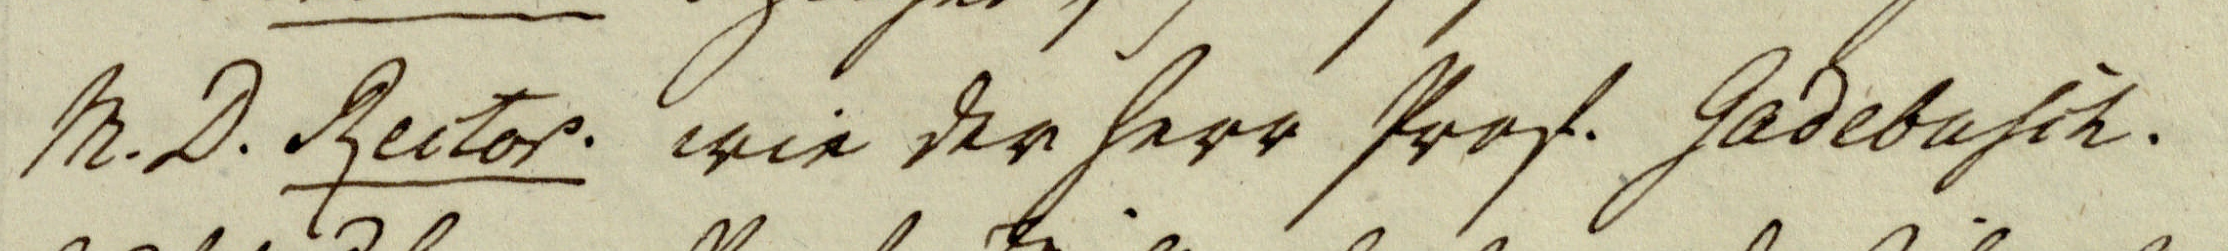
M. D. Rector. wie der Herr Prof. Gadebusch.
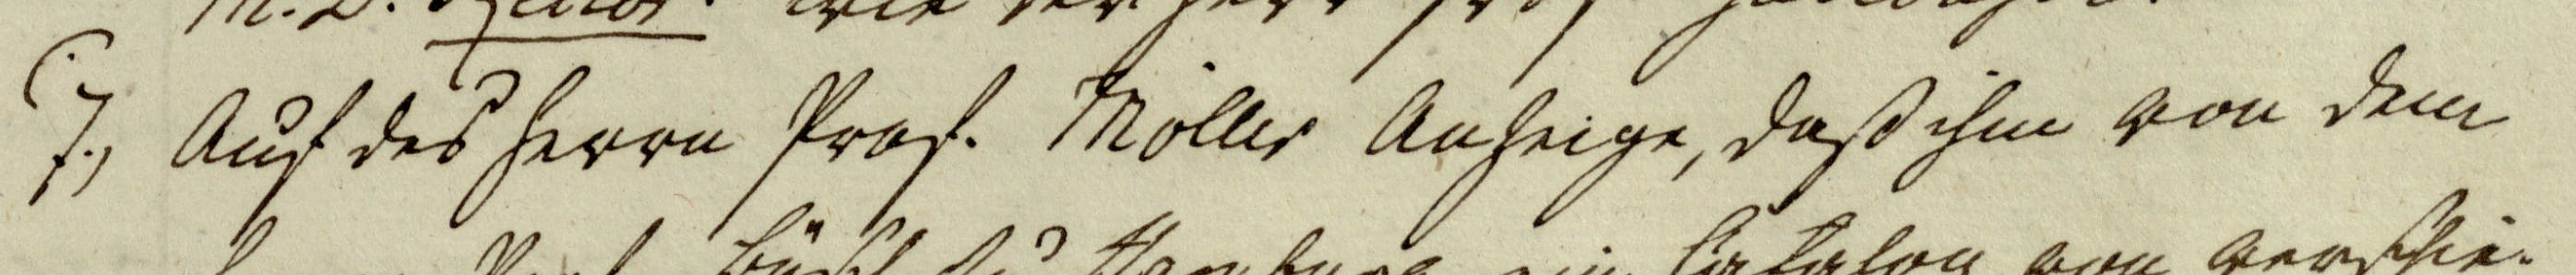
7., Auf des Herrn Prof. Möller Anzeige, daß ihm von dem
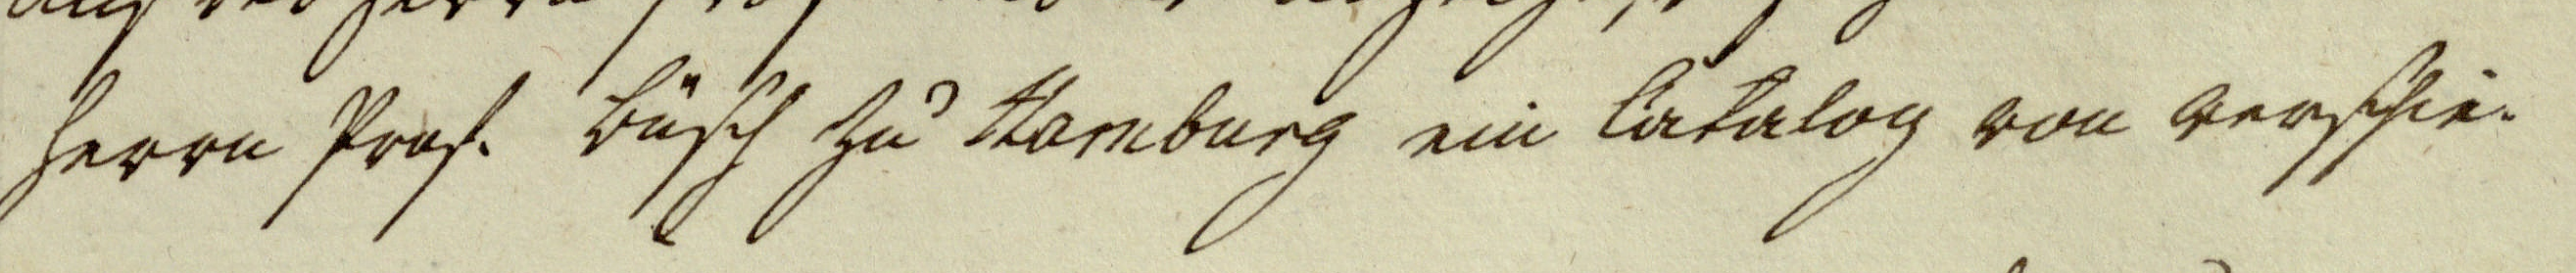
Herrn Prof. Busch zu Hamburg ein Catalog von verschie¬
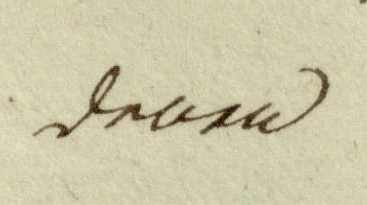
denen
